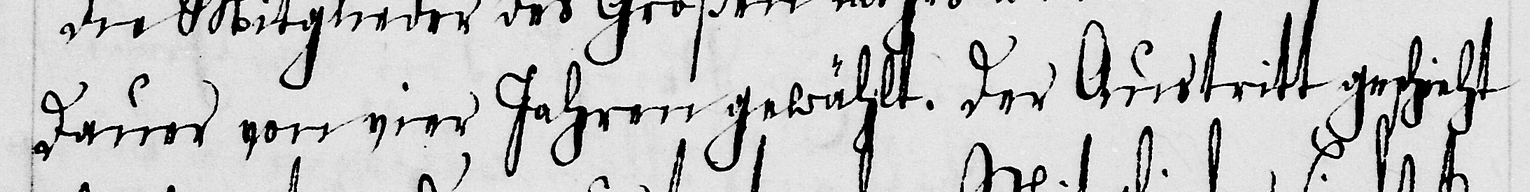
Dauer von vier Jahren gewählt. Der Austritt geschieht
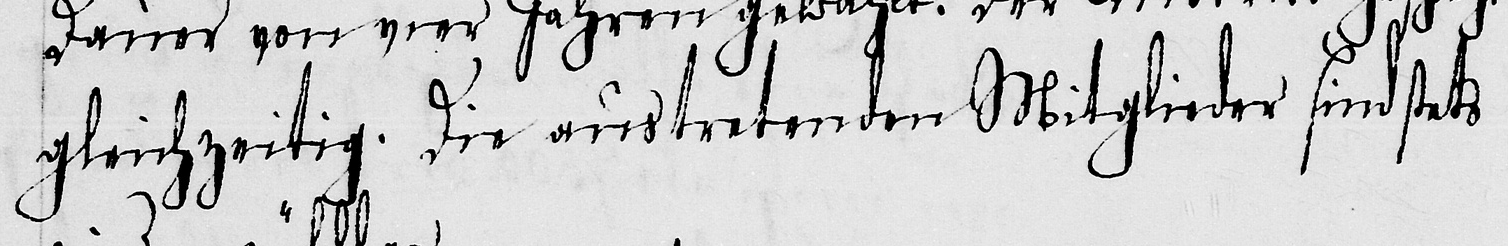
gleichzeitig. Die austretenden Mitglieder sind stets
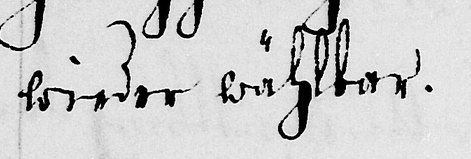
wieder wählbar.
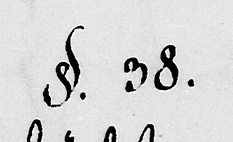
§. 38.
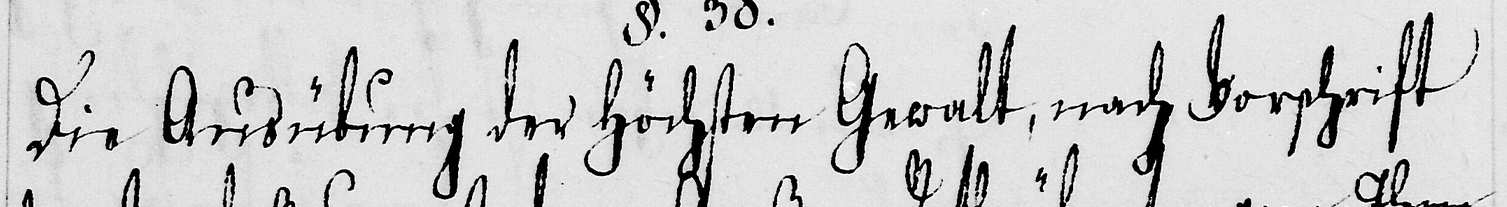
Die Ausübung der Höchsten Gewalt, nach Vorschrift
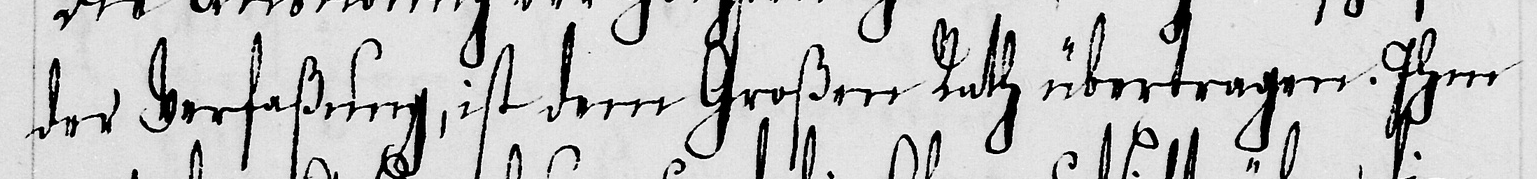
der Verfaßung, ist dem Großen Rath übertragen. Ihm
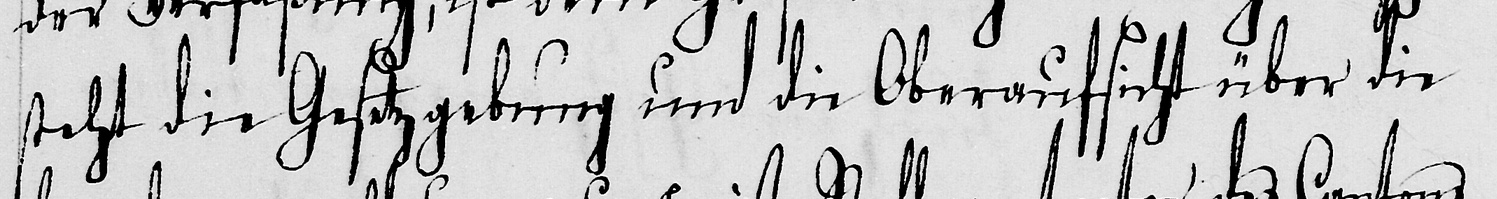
steht die Gesetzgebung und die Oberaufsicht über die
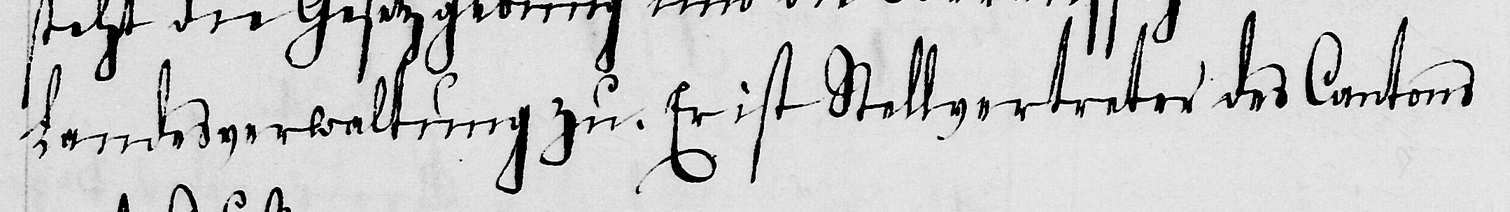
Landesverwaltung zu. Er ist Stellvertreter des Cantons
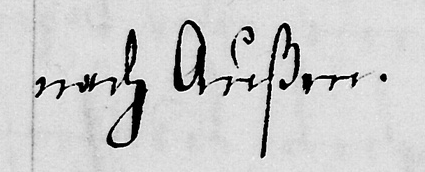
nach Außen.
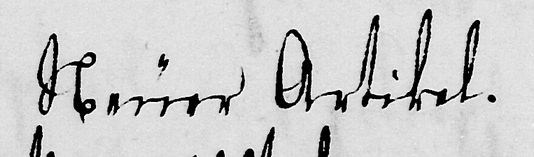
Neuer Artikel.
